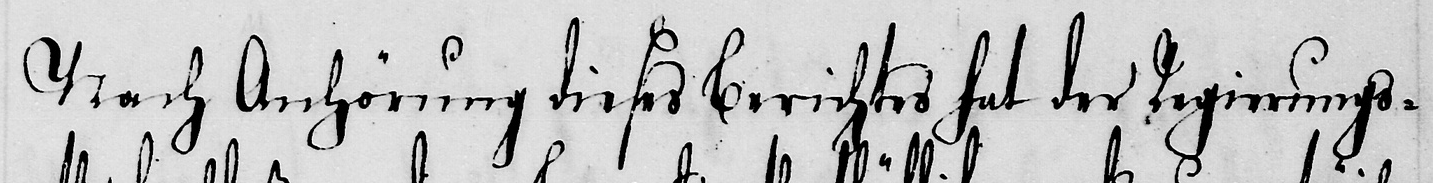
Nach Anhörung dieses Berichtes hat der Regierungs¬
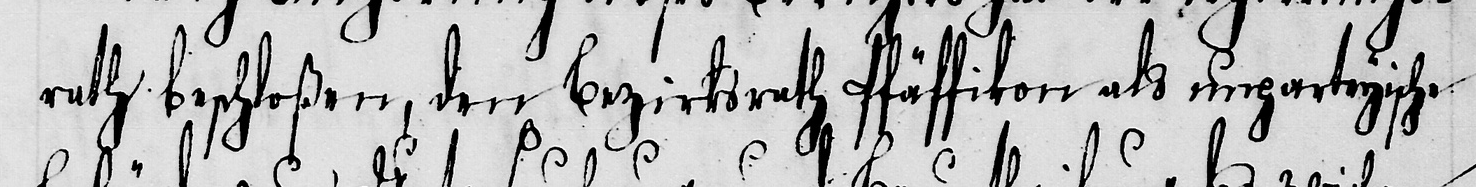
rath beschloßen, den Bezirksrath Pfäffikon als unparteyisc¬
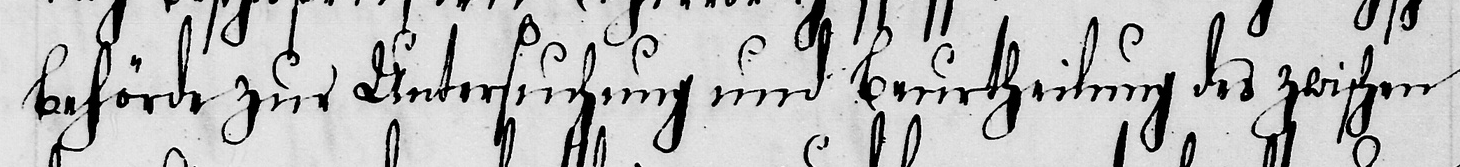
Behörde zur Untersuchung und Beurtheilung des zwischen
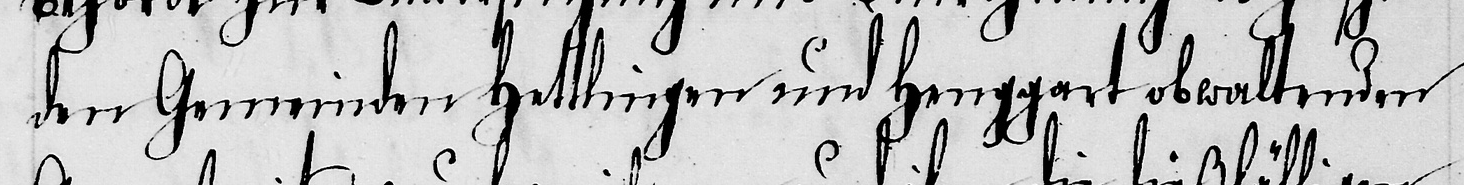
den Gemeinden Hettlingen und Henggart obwaltenden
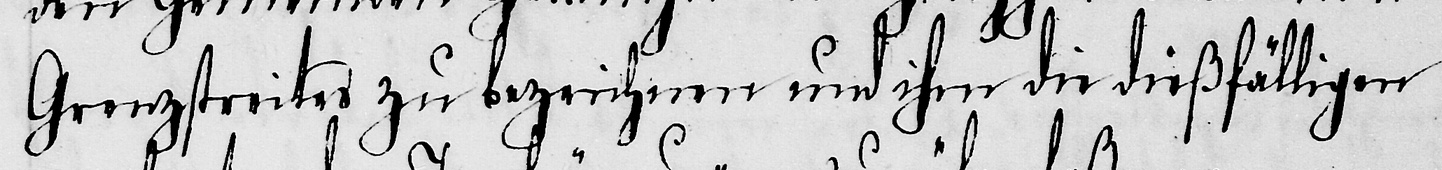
Grenzstreites zu bezeichnen und ihm die dießfälligen
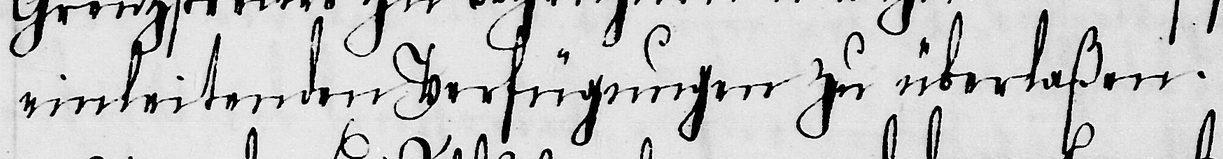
einleitenden Verfügungen zu überlaßen.
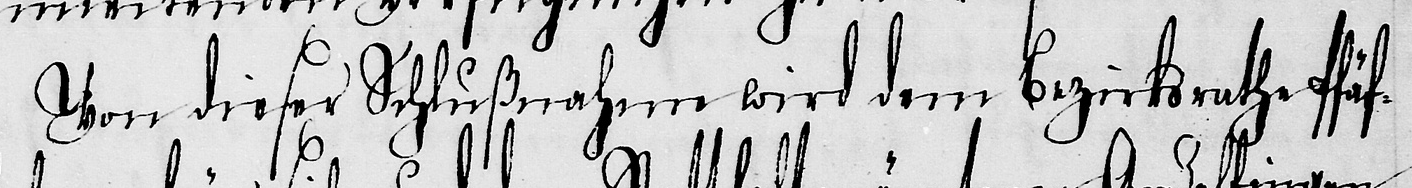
Von dieser Schlußnahme wird dem Bezirksrath Pfäf¬
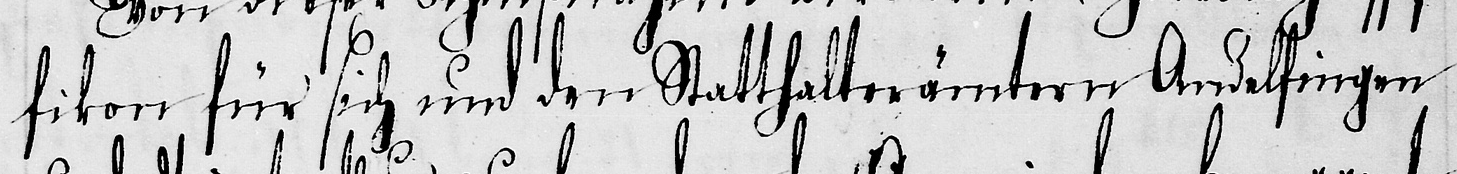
fikon für sich und den Statthalterämtern Andelfingen
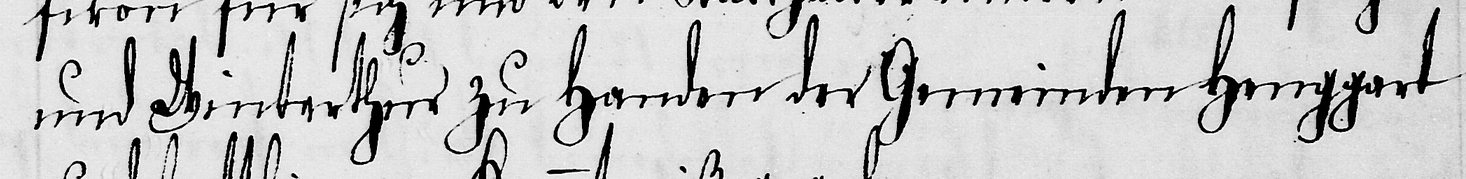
und Winterthur zu Handen der Gemeinden Henggart
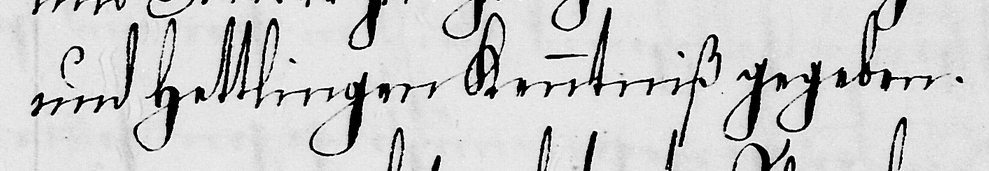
und Hettlingen Kenntniß gegeben.
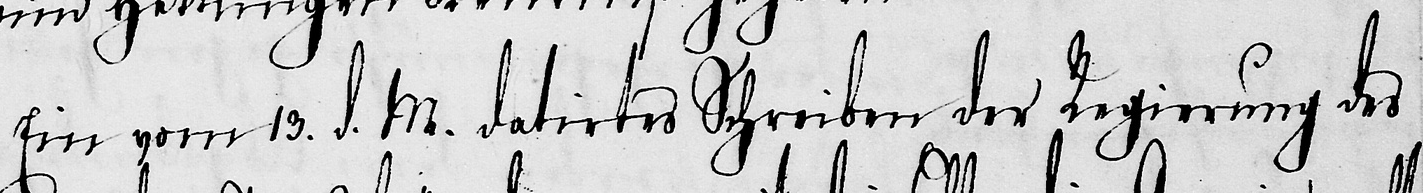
Ein vom 13. d. M. datirtes Schreiben der Regierung des
